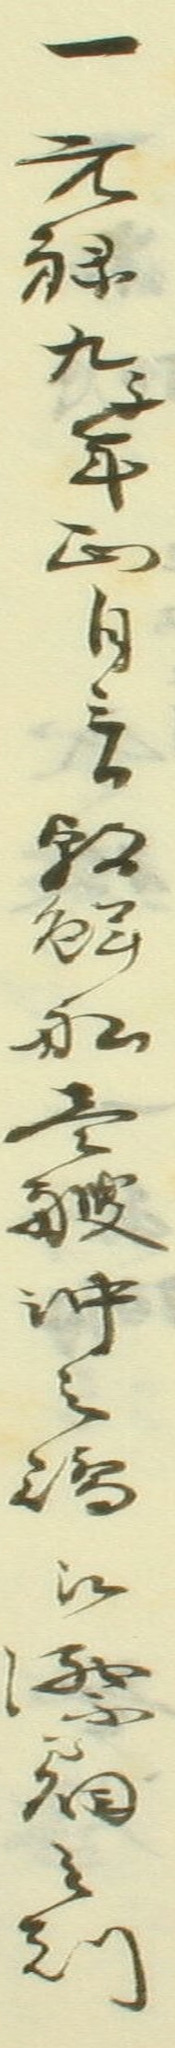一元禄九子年正月三日朝鮮船壱艘沖之島え漂着刻
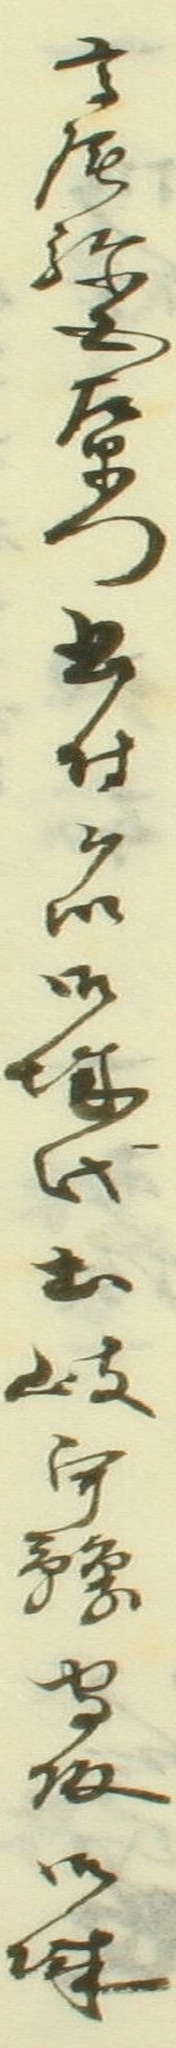高尾弥五左衛門書付を以御城代土岐伊豫守殿御城
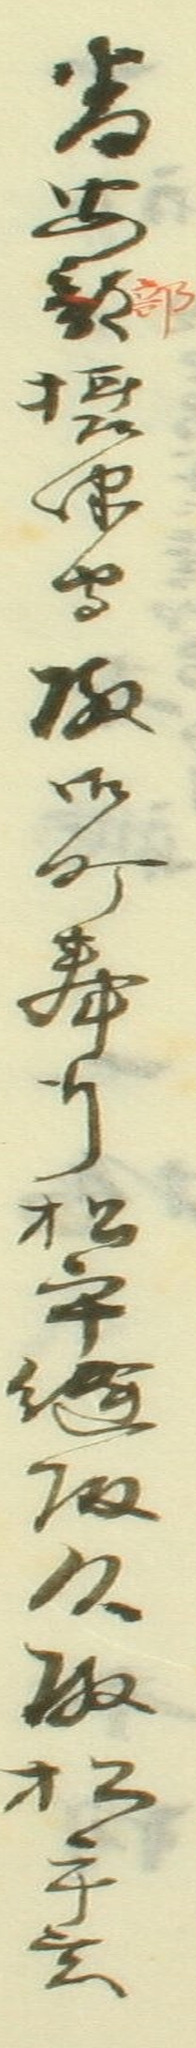番阿部摂津守殿御町奉行松平縫殿頭殿松平玄
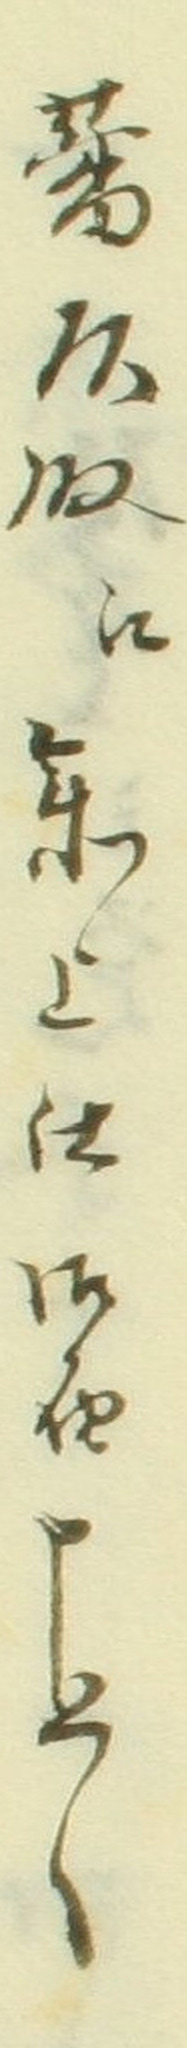蕃頭殿え参上仕御届申上候
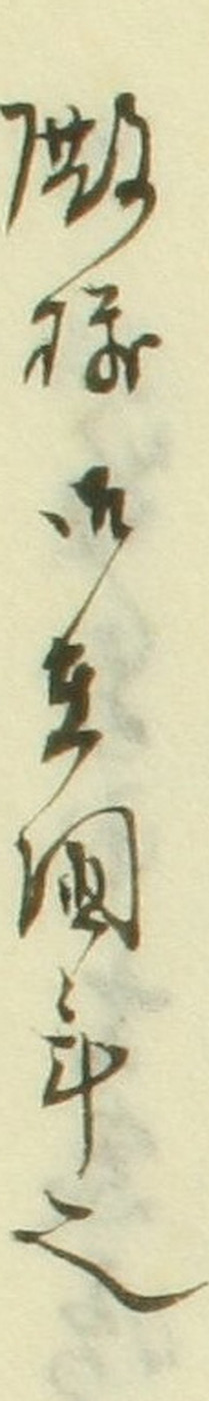殿様御在国年也
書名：朝鮮船御領内漂流記 坤
